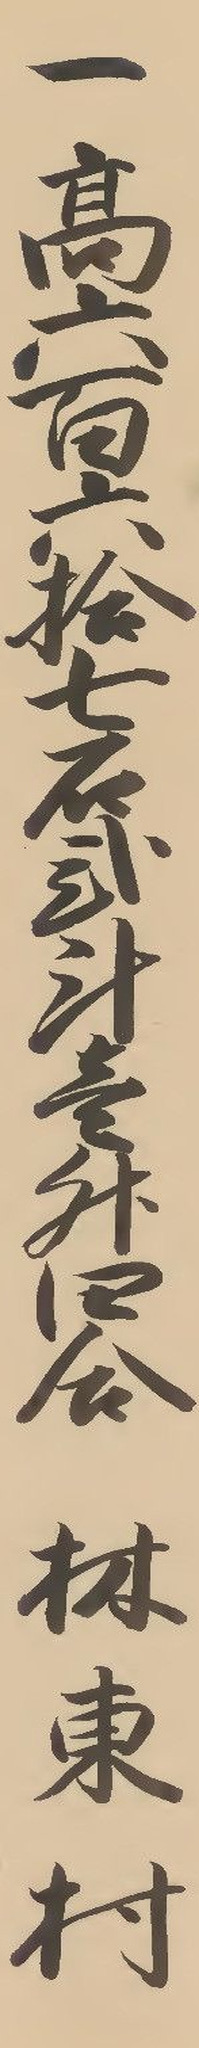一高六百六拾七石弐斗壱升四合林東村
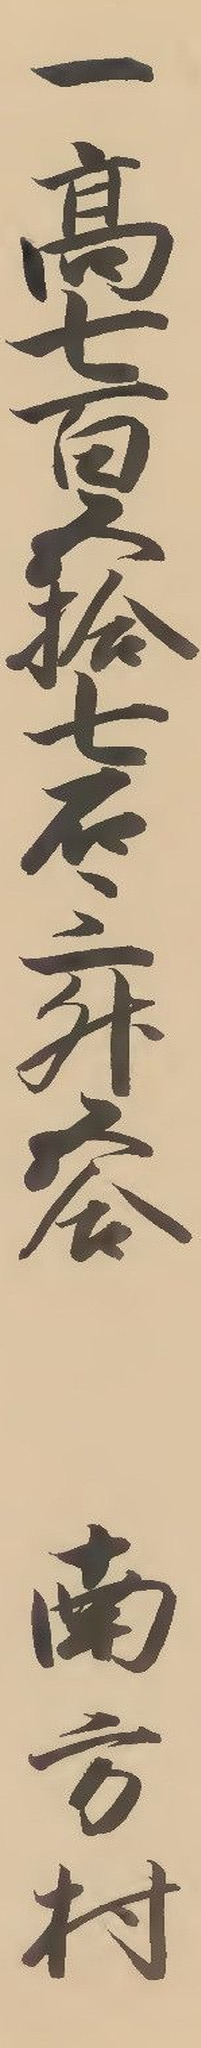一高七百五拾七石三升五合南方村
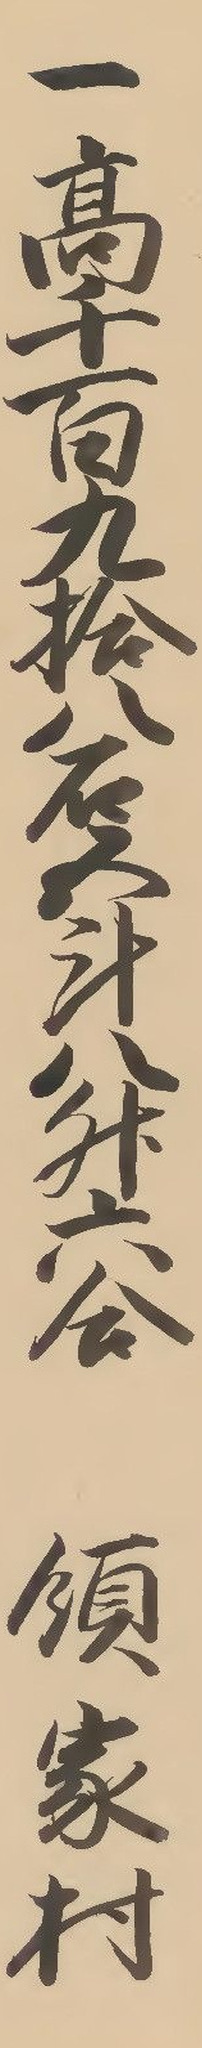一高千百九拾八石五斗八升六合領家村

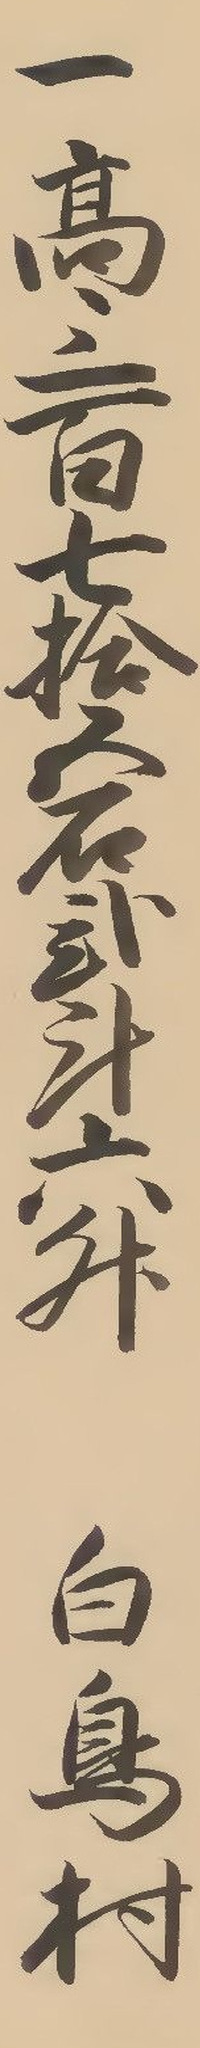一高三百七拾五石弐斗六升白鳥村
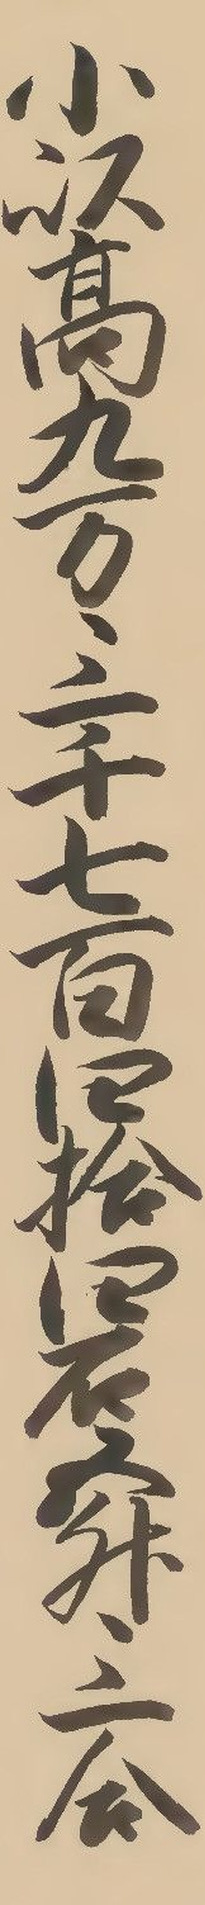小以高九万三千七百四拾四石五升三合
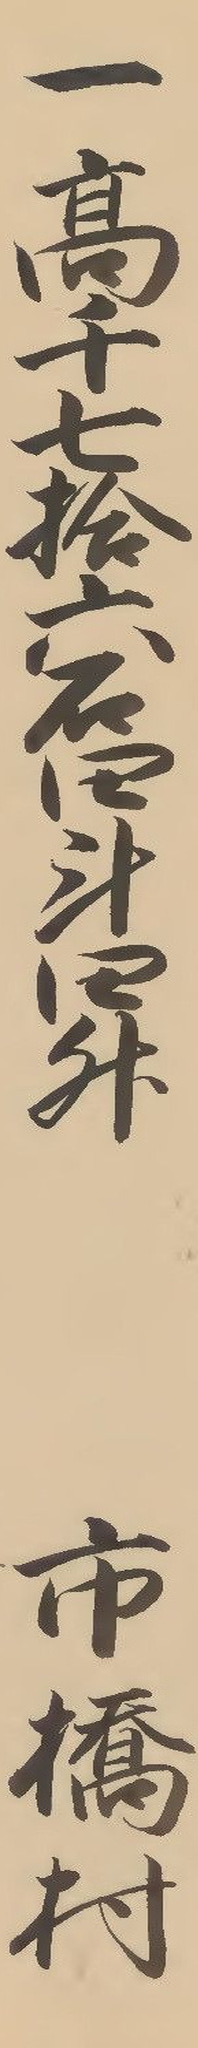一高千七拾六石四斗四升市橋村
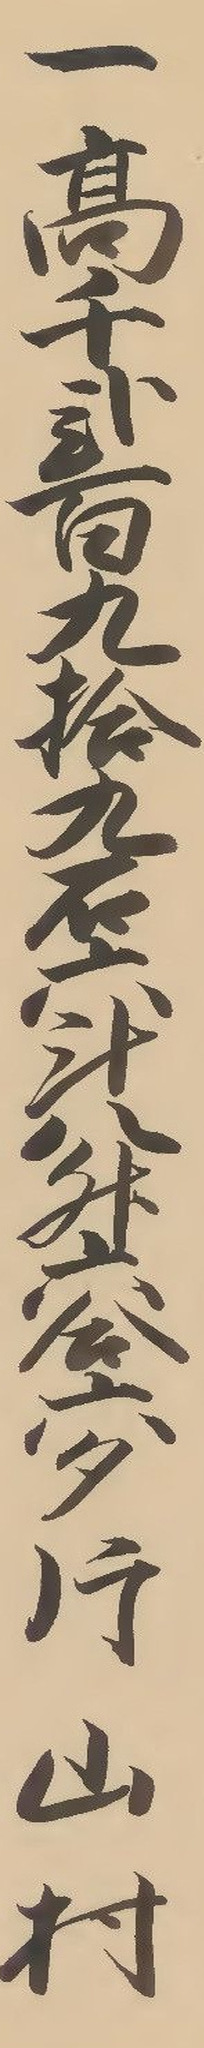一高千弐百九拾九石六斗八升六合六勺片山村
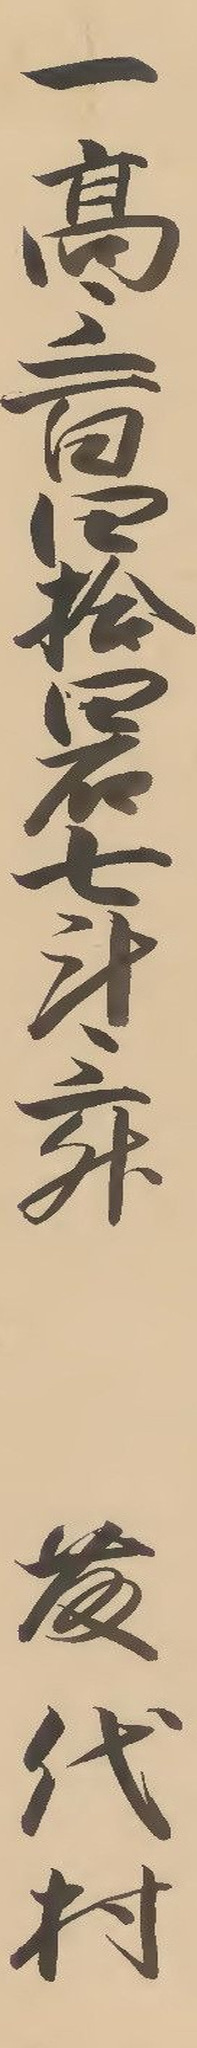一高三百四拾四石七斗三升藤代村

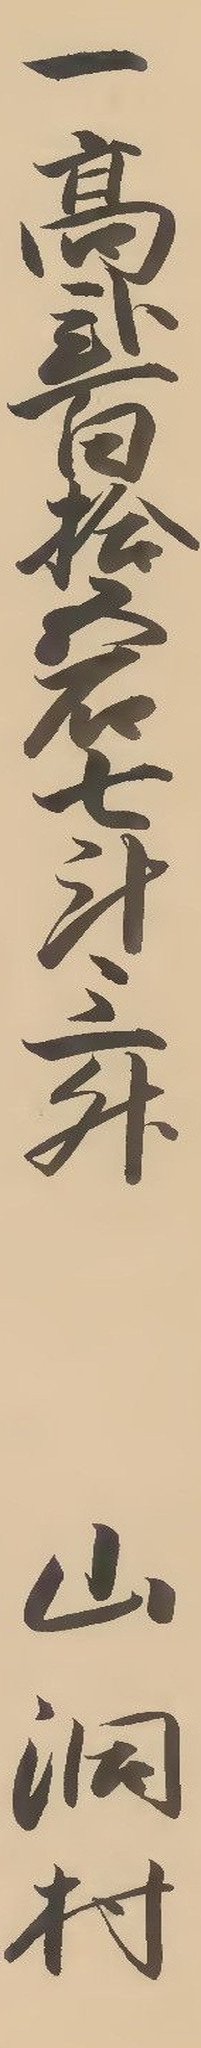一高弐百拾五石七斗三升山洞村
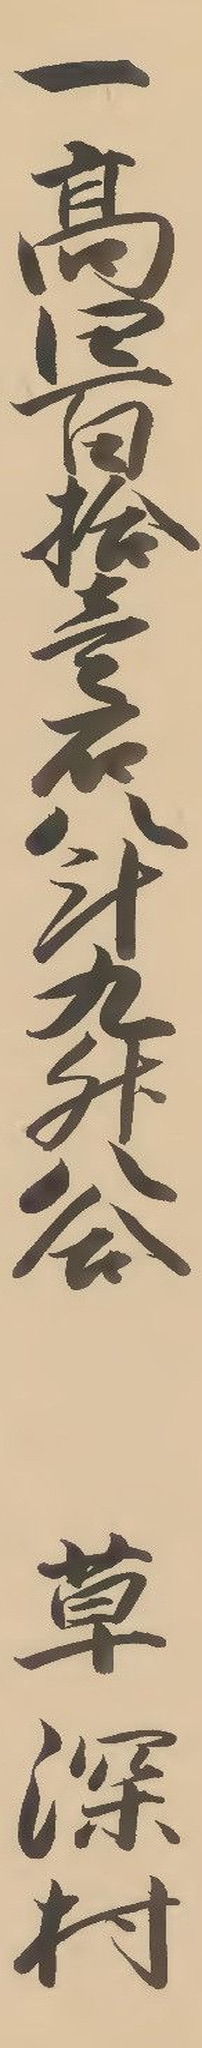一高四百拾壱石八斗九升八合草深村
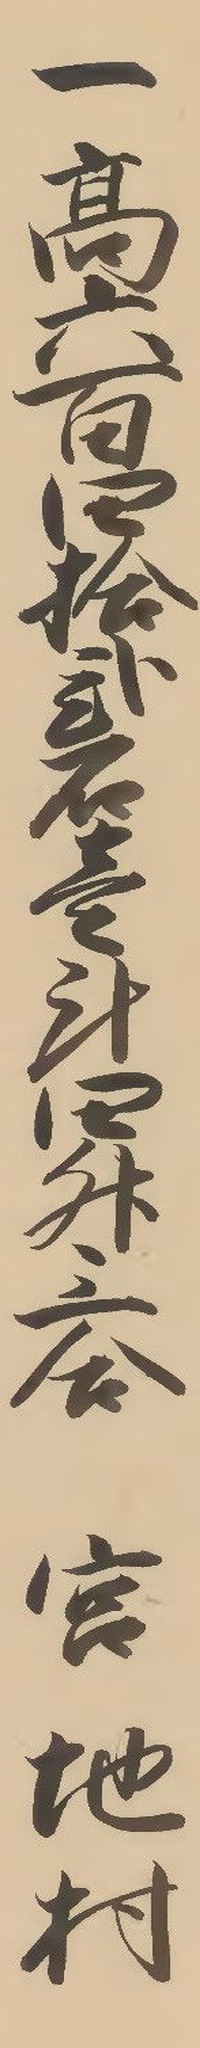一高六百四拾弐石壱斗四升三合宮地村
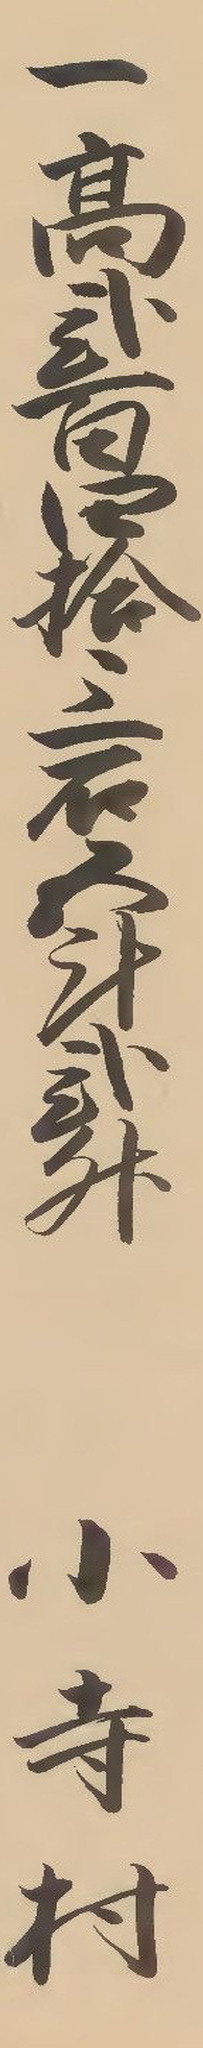一高弐百四拾三石五斗弐升小寺村
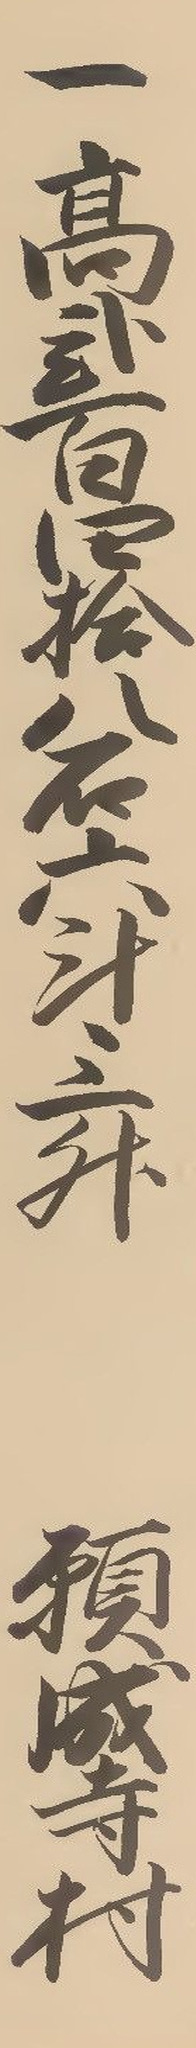一高弐白四拾八石六斗三升願成寺村
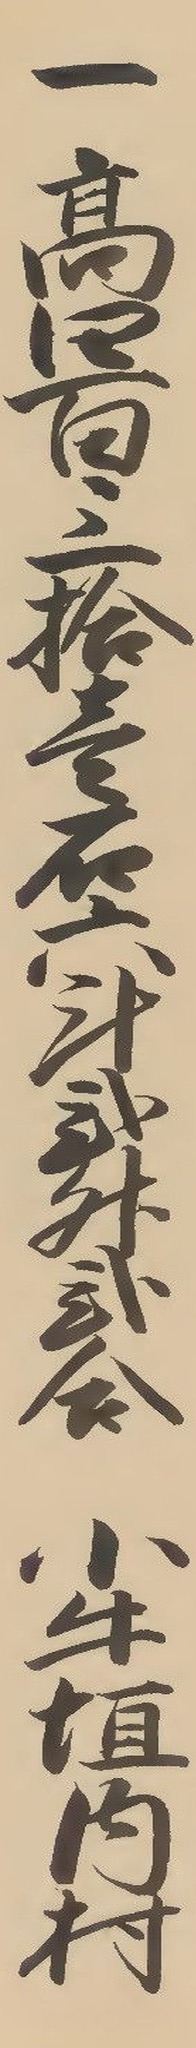一高四百三拾壱石六斗弐升弐合小牛垣内村
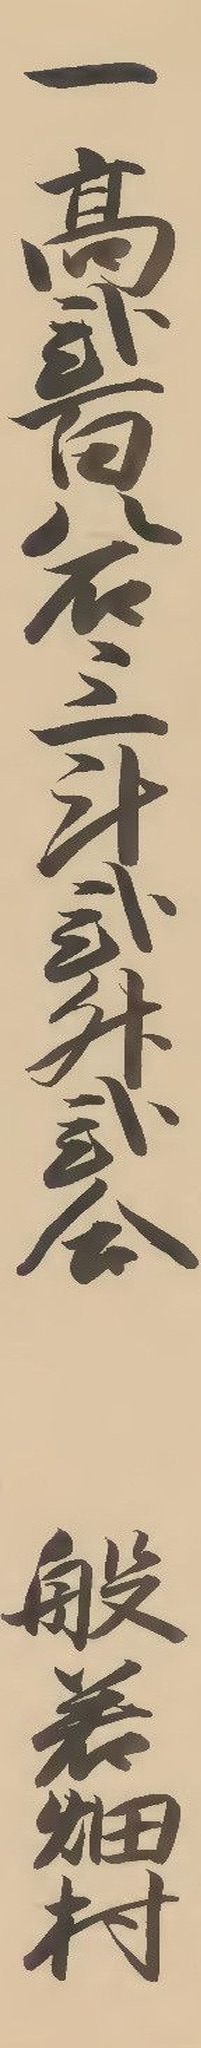一高弐百八石三斗弐升弐合般若畑村
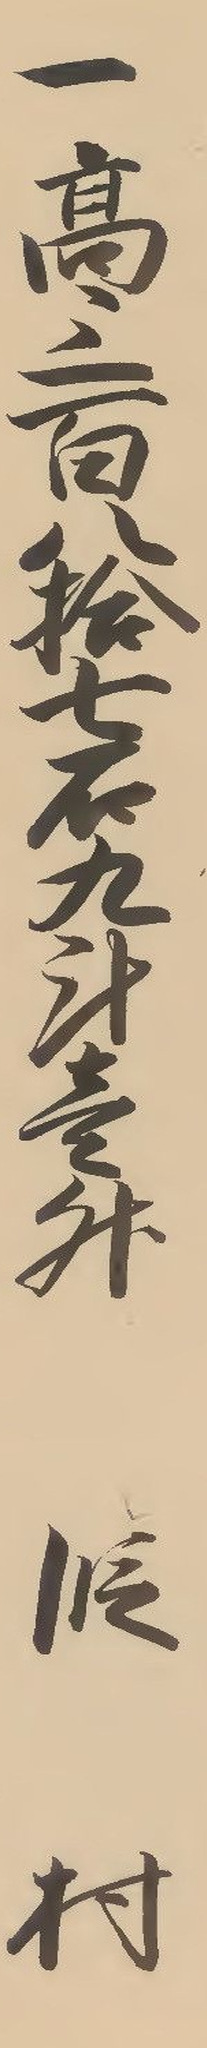一高三百八拾七石九斗壱升段村
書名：美濃国郷帳
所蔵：国立公文書館 National Archives of Japan
